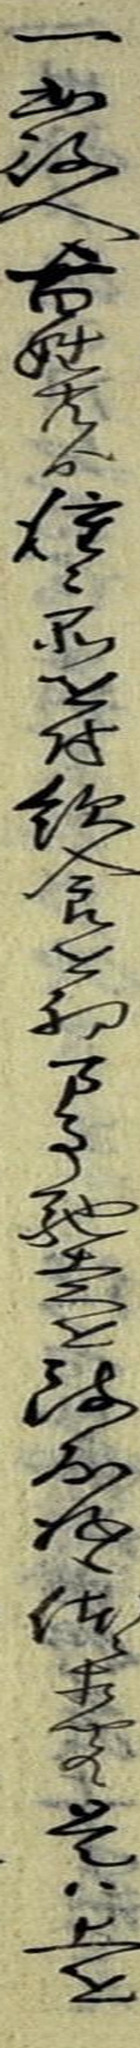一出役人百姓共ゟ種々品を付飲食を初万事馳走を致度候体ニ相聞候是ハ上を
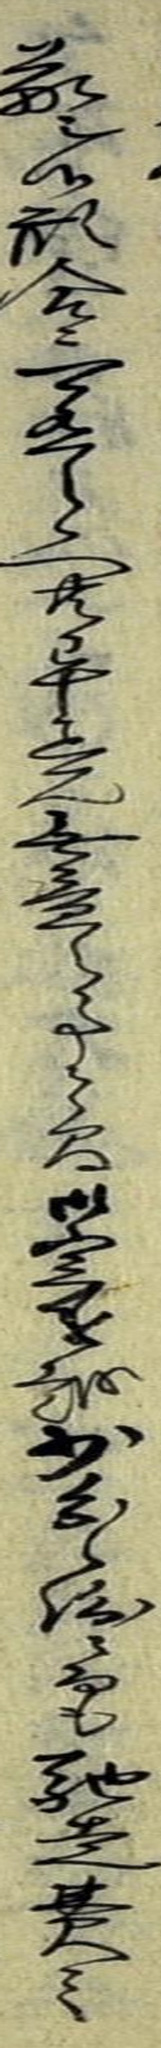敬シ候形合ニ可有之候へ共畢竟無益之事ニ候間御定を越少分之儀ニ而も馳走費之
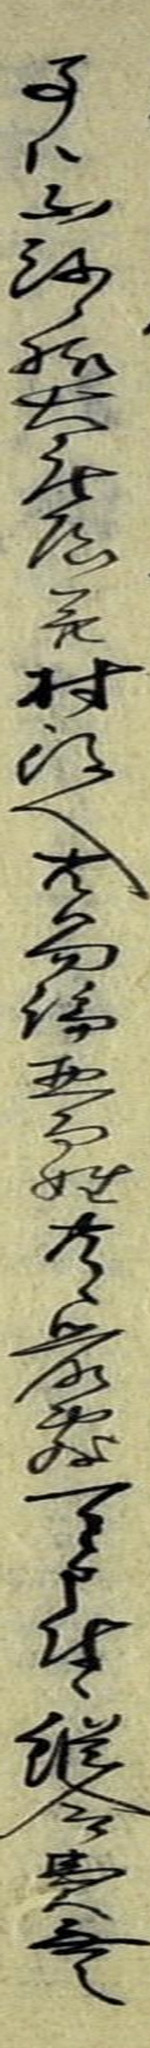事ハ不致候様大庄屋并村役人共ハ勿論惣百姓共へ厳敷可被申付候縦令費無之
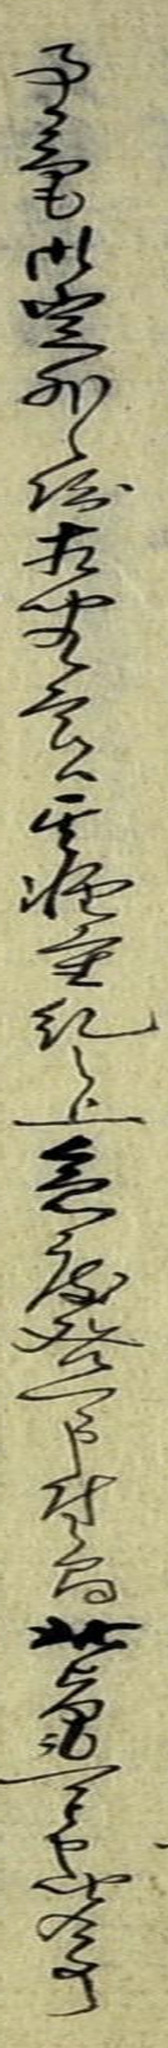事ニ而も御定外之儀相聞候節ハ其軽重糺之上急度咎可申付候間此旨も可被申聞事
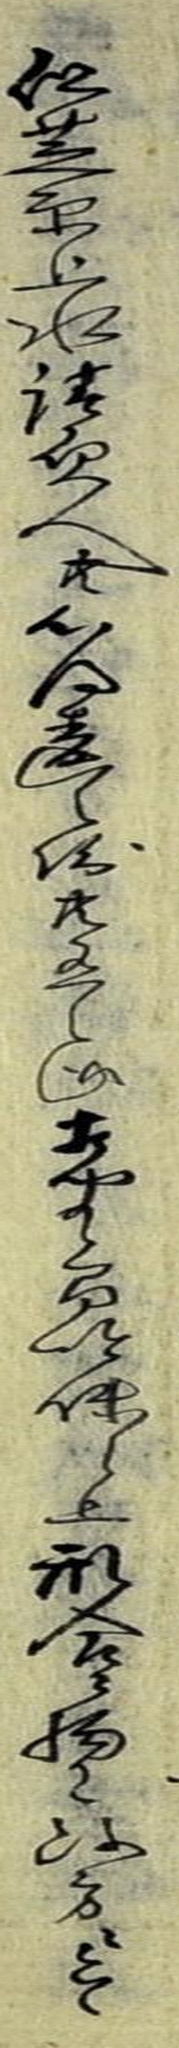但芝原上水請負人共心得違之儀共有之趣相聞候間吟味之上形合ニ拘り候致方ニ候ハヽ
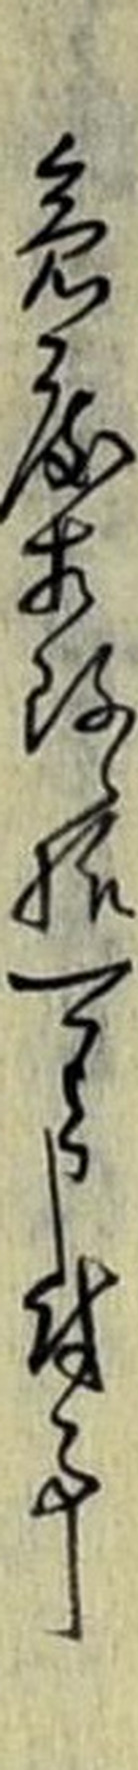急度相改候様可被申付事
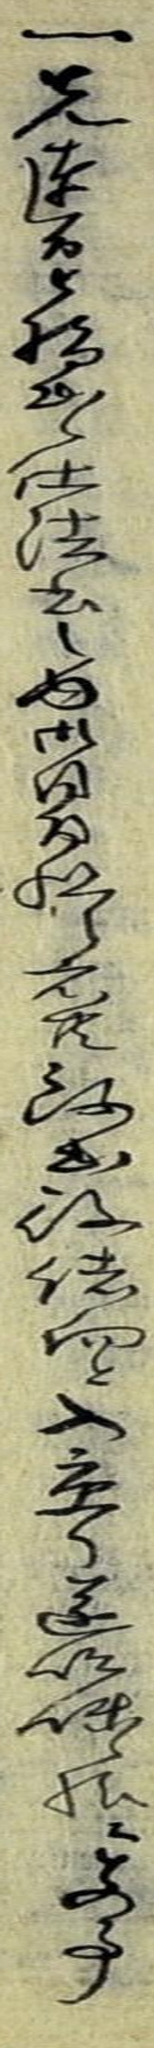一先達而被指出候仕法書之内御目付組之者共致出役諸向と入交り遂吟味候様ニとの事
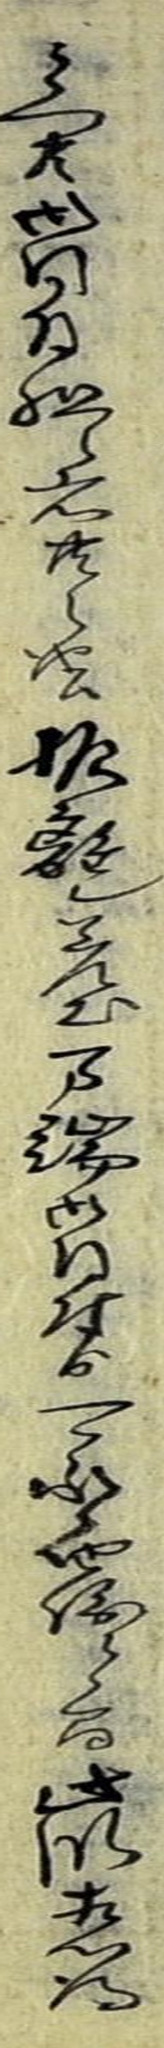ニ候へ共御目付組之者共之儀ハ振離レ差出万端御目付ゟ可承届儀ニ候間此段相心得
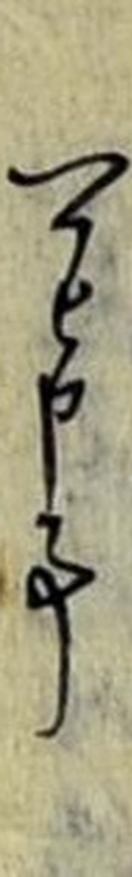可被申事
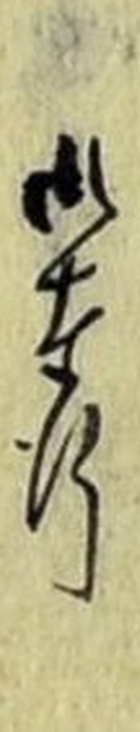御奉行
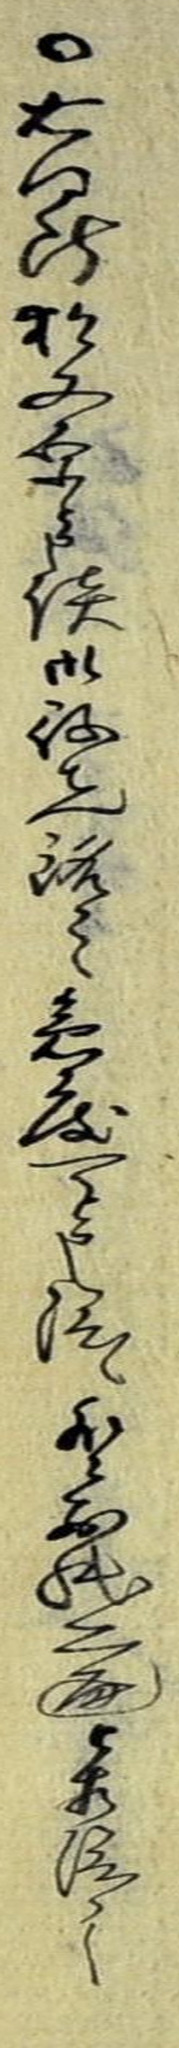〇右同断猶又厚被申談御役先銘々へ急度可被申渡候外ニ別紙二通被相渡之

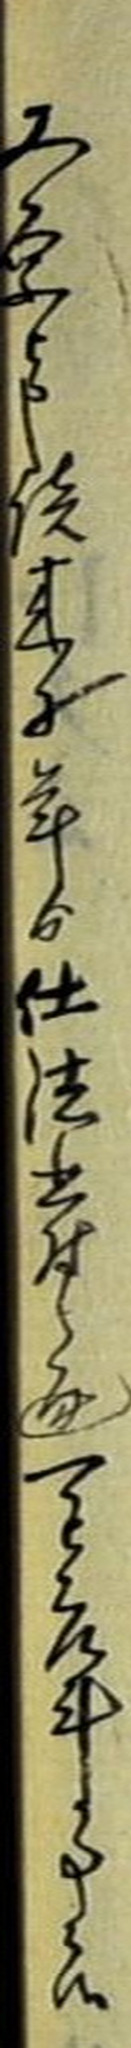又厚被申談来寅年ゟ仕法書付之通可被取計事ニ候
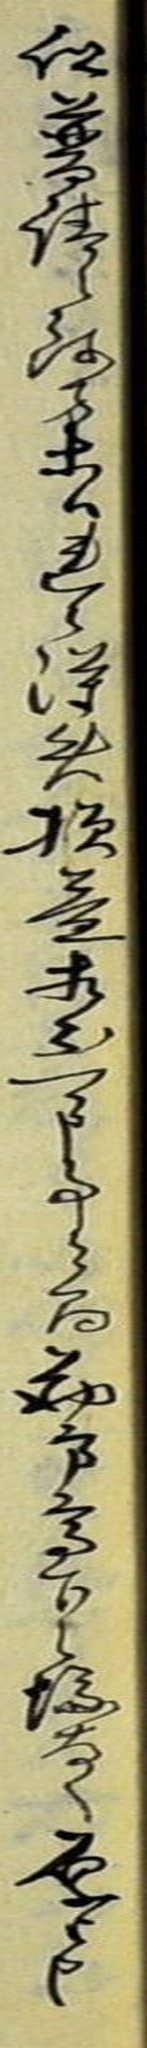但普請之致方等ハ連々得失損益相分可申事ニ候間勤方高下之隔なく厚被申

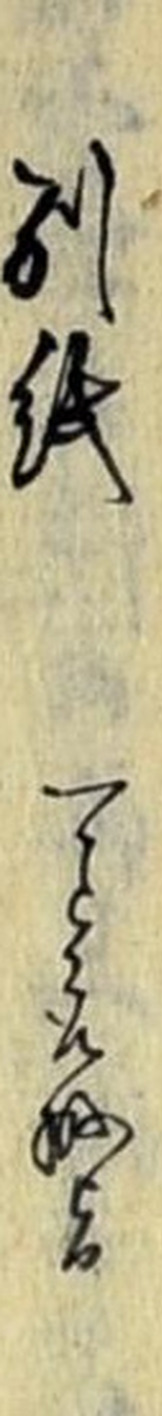別紙可被取扱旨
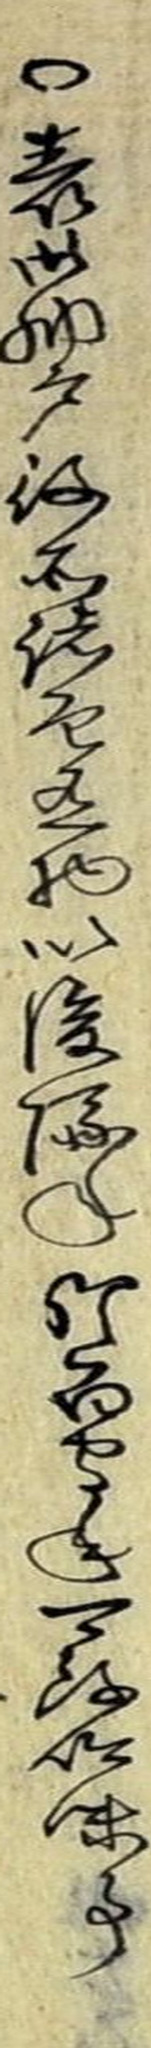〇表御納戸役所諸色有物以後隔年御留守年可致吟味事
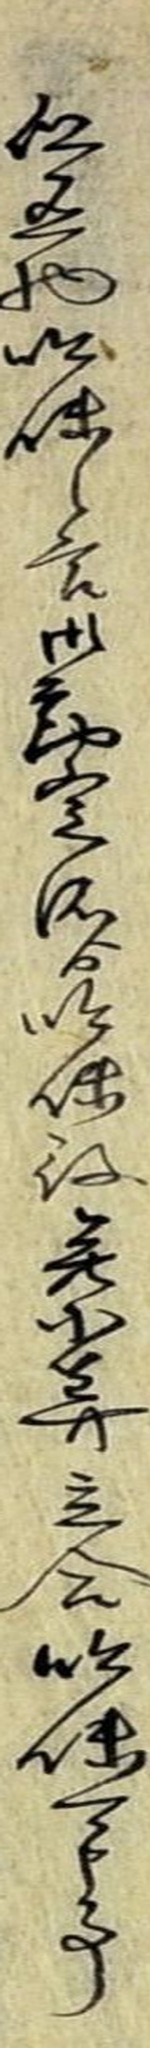但有物吟味之節御勘定所ゟ吟味役并小算立合吟味可申事
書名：命令之部 三
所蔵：福井県文書館 Fukui Prefectural Archives
